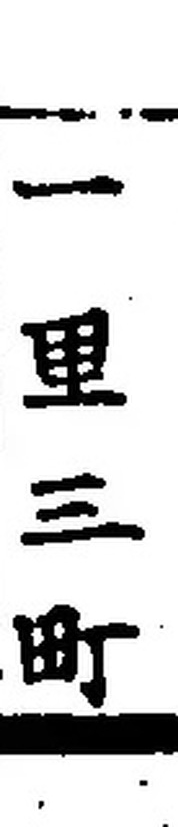一里三町

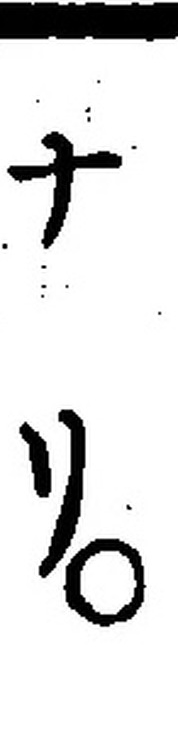ナリ。
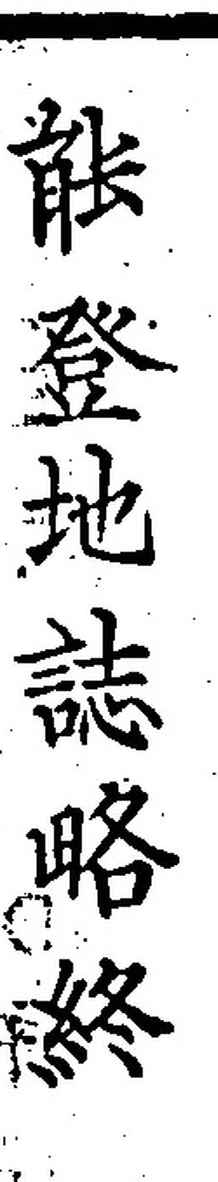能登地誌略終
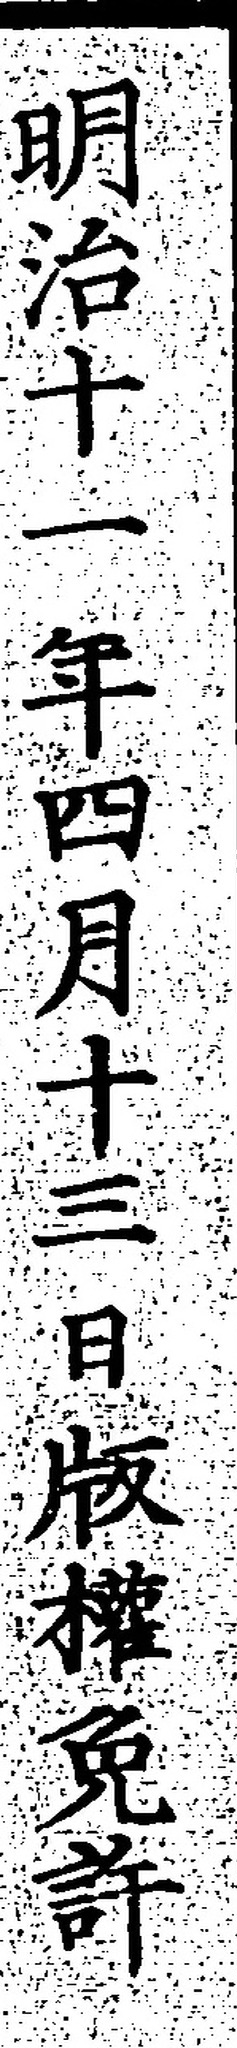明治十一年四月十三日版権免許
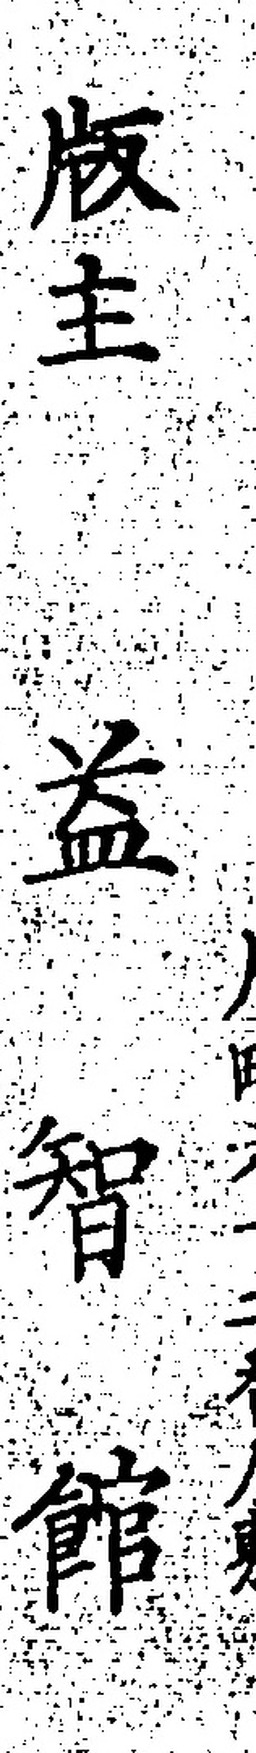版主益智館
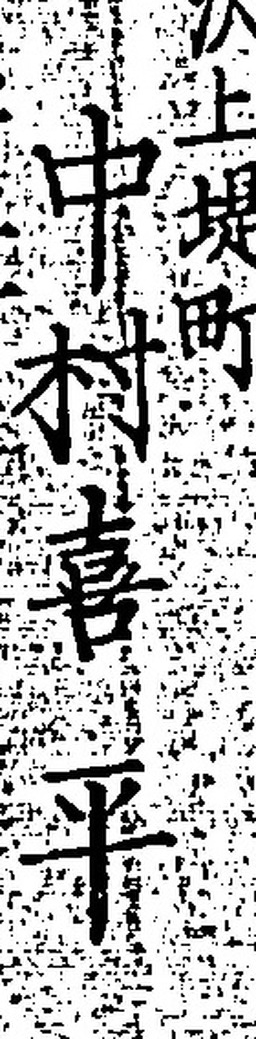中村喜平
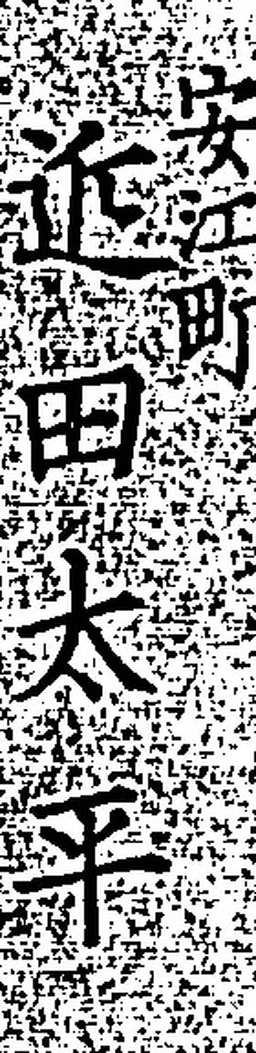近田太平
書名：能登地誌略
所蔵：国立国会図書館 National Diet Library, JAPAN
